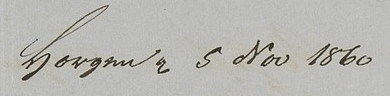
Horgen den 5 Nov 1860
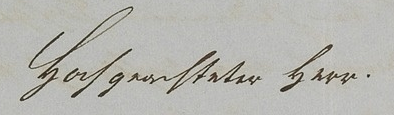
Hochgeachteter Herr.
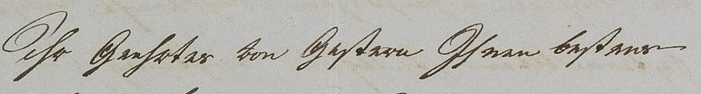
Ihr Geehrtes von gestern Ihnen bestens
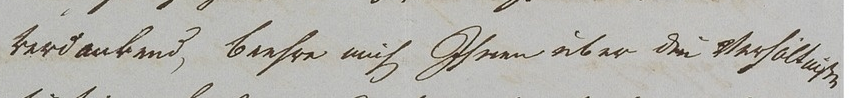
verdankend, beehre mich Ihnen über die Verhältniße
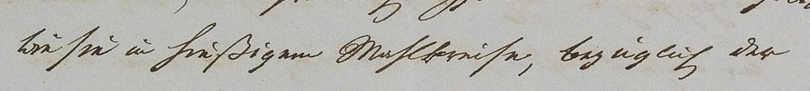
wie sie in hießigem Wahlkreise, bezüglich der
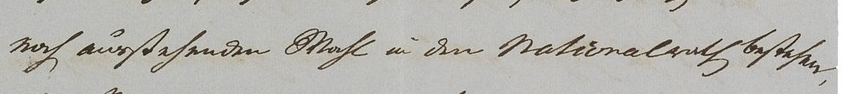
noch ausstehenden Wahl in den Nationalrath bestehen,
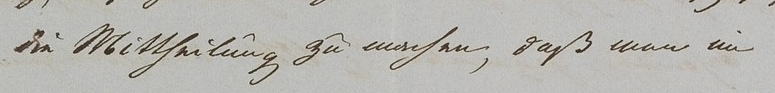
die Mittheilung zu machen, daß man im
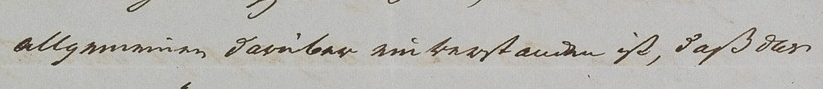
allgemeinen darüber einverstanden ist, daß das
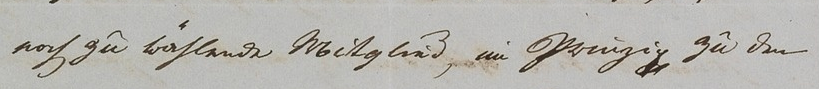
noch zu wählende Mitglied, im Prinzip zu den
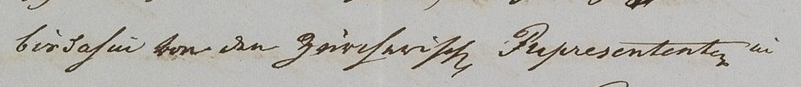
bis dahin von den Zürcherischen Representanten in
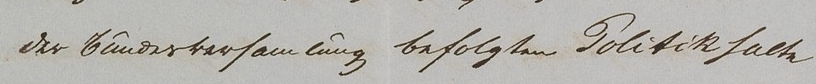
der Bundesversamlung befolgten Politik halte
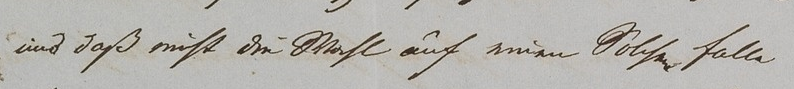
und daß nicht die Wahl auf einen Solchen falle
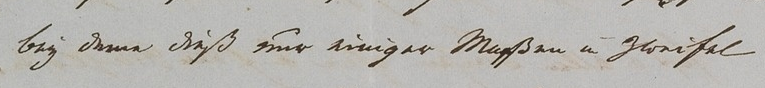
bey dem dieß nur einiger Maaßen in Zweifel
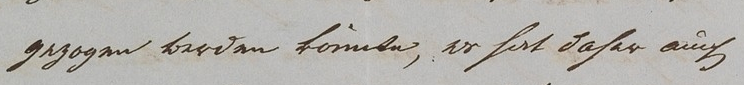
gezogen werden könnte, es hat daher auch
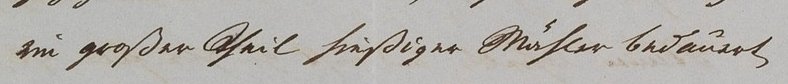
ein großer Theil hießiger Wähler bedauert,
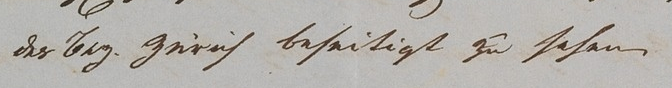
des Bez. Zürich beseitigt zu sehen.
